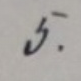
5.
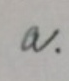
a
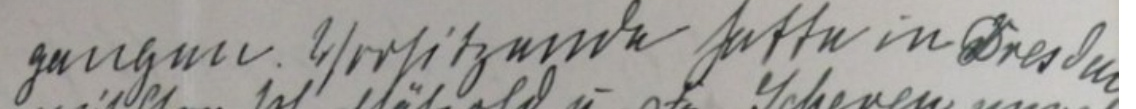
gangen. Voristzende hatte in Dresden
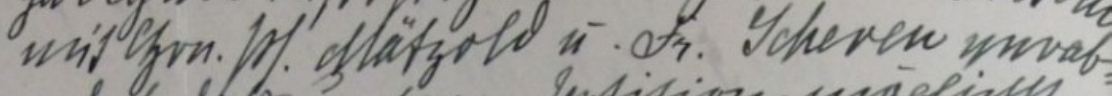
mit Hrn. Pf. Mätzls u. Fr. Scheren verab
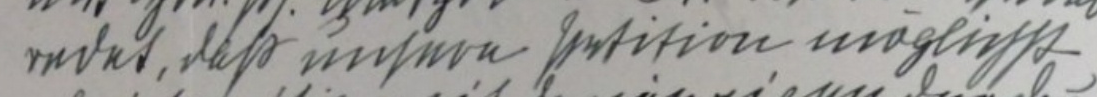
redet, daß unsere Petition möglichst
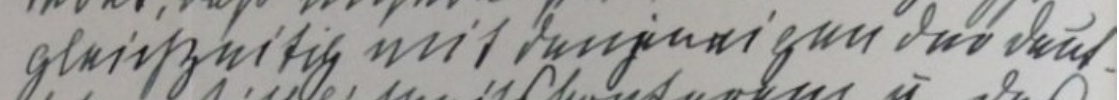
gleichzeitig mit derendigen der deut
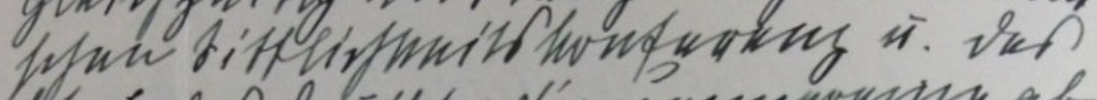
schen sittlichen Konferenz u des
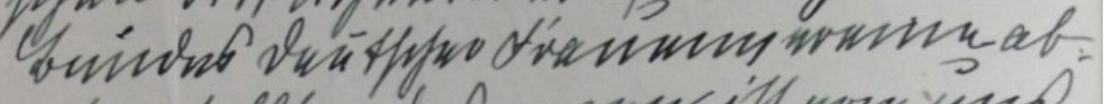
Bundes deutscher Frauenvereine ab
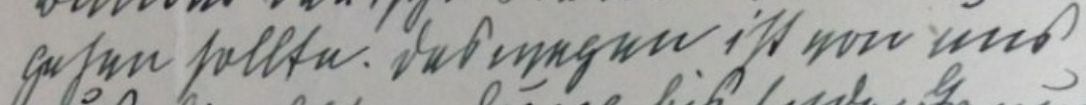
geben sollte. Daswegen ist von uns
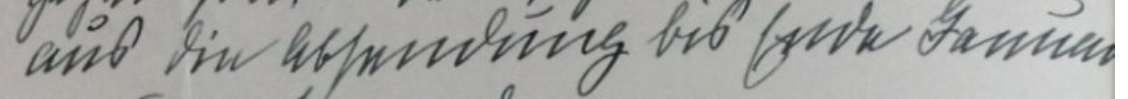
aus die ABfassung bis Ende Januar
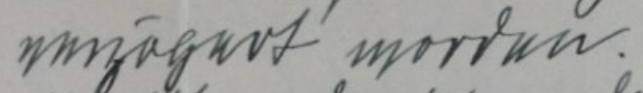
verzögert worden.
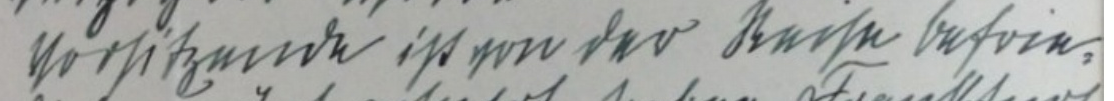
Vorsitzende ist von der Reise befrie
